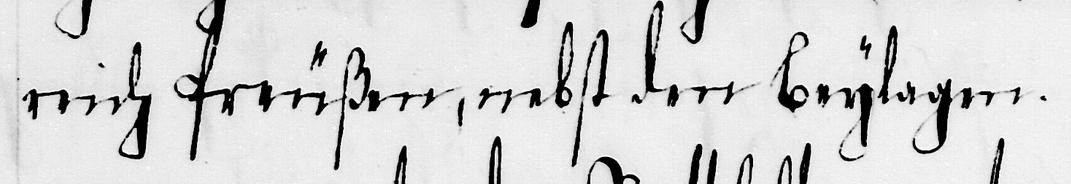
greich Preußen, nebst den Beylagen.
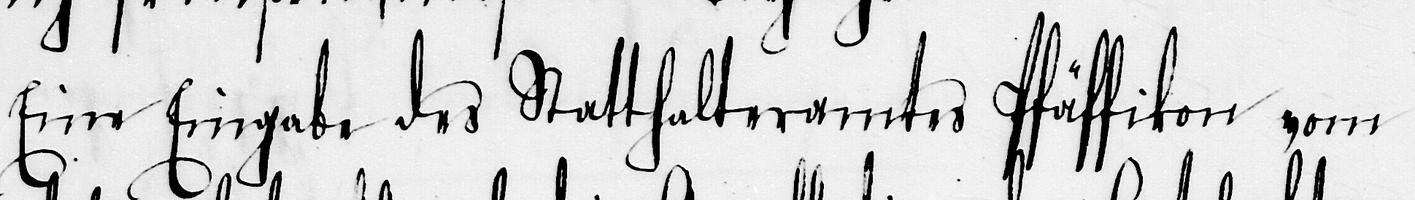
Eine Eingabe des Statthalteramtes Pfäffikon vom
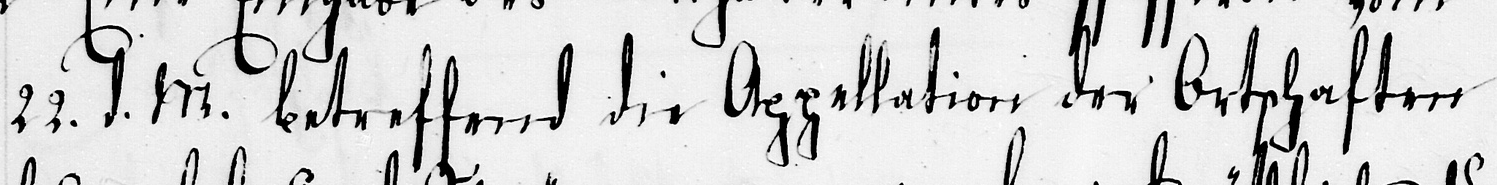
22. d. M. betreffend die Appellation der Ortschaften
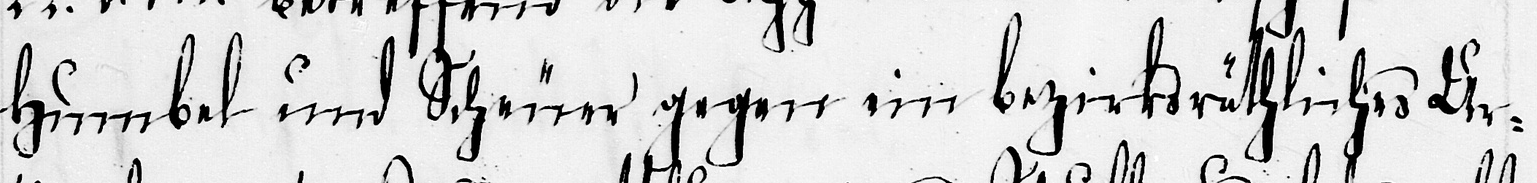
Humbel und Scheuer gegen ein bezirksräthliches Ur¬
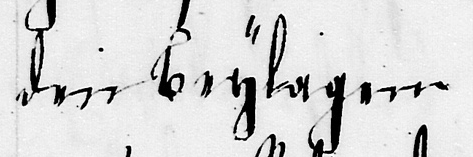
den Beylagen.
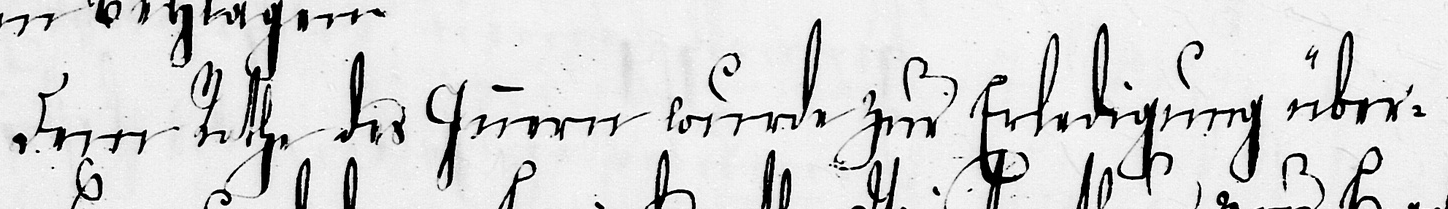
Dem Rathe des Innern wurde zur Erledigung über¬
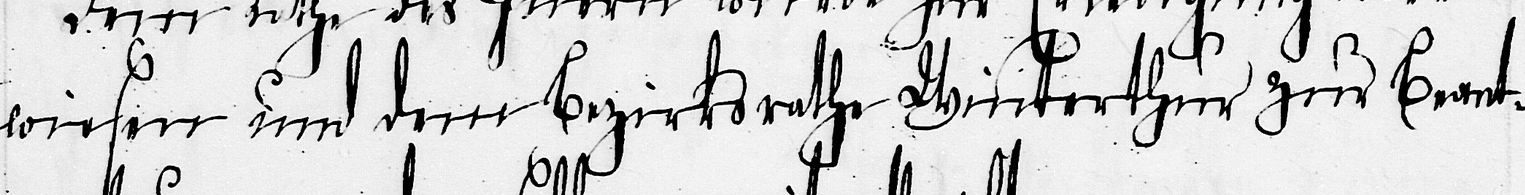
wiesen und dem Bezirksrathe Winterthur zur Beant¬
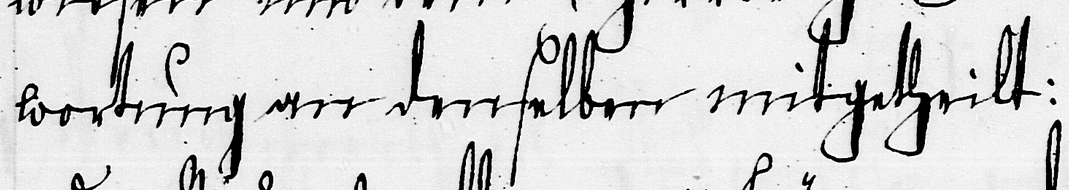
wortung an denselben mitgetheilt:
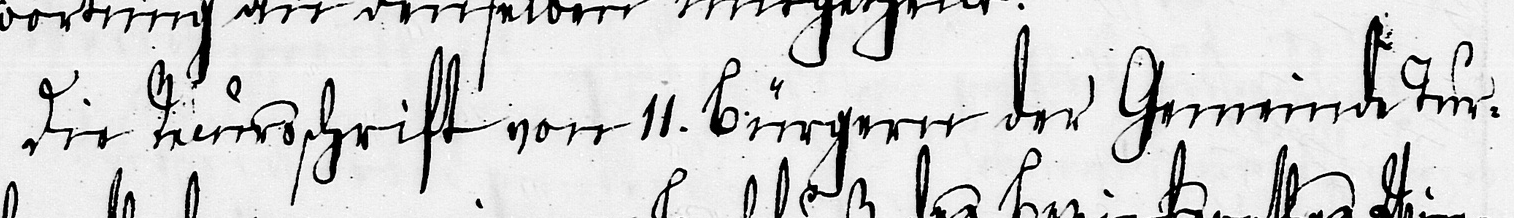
Die Recursschrift von 11. Bürgern der Gemeinde Tur¬
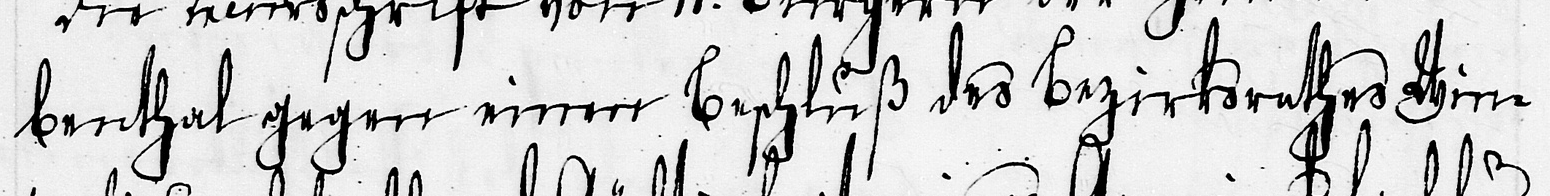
benthal gegen einen Beschluß des Bezirksrathes Win¬
